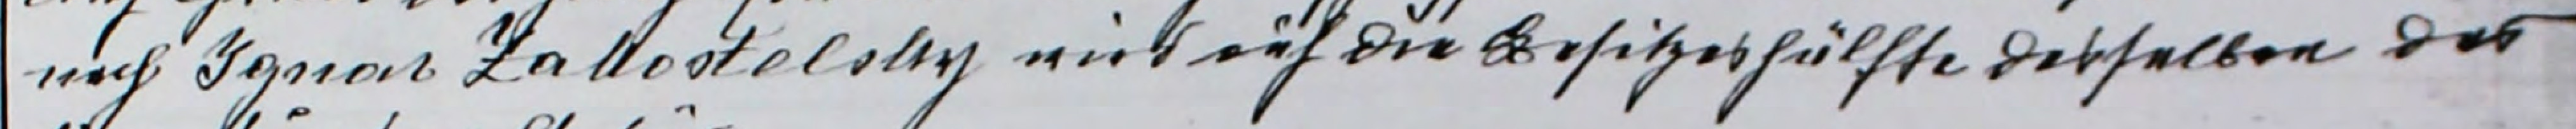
nach Ignaz Zakostelsky wird auf die Besitzeshälfte derselben das
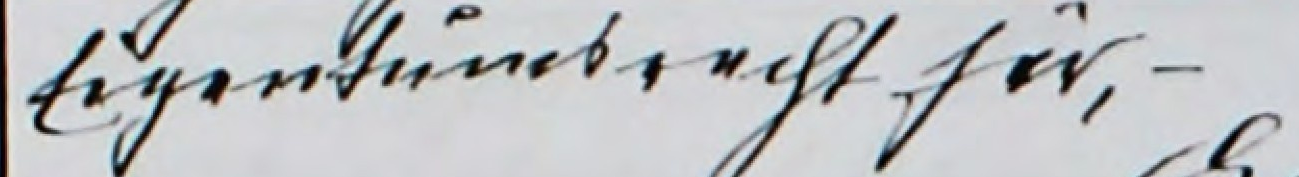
Eigentumsrecht für, -
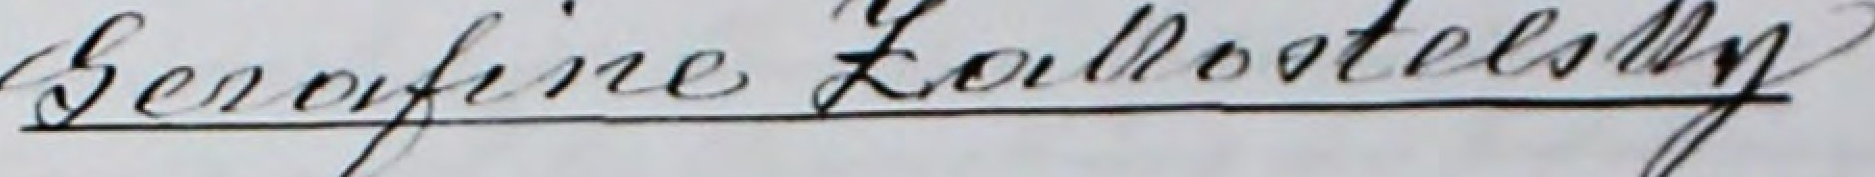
Gerafine Zakostelsky
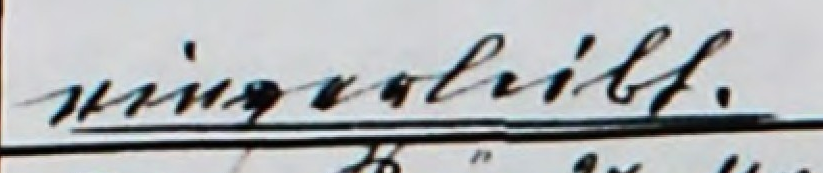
einverleibt.
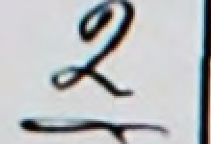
2
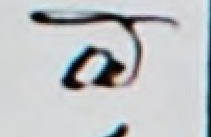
a
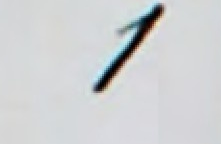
1
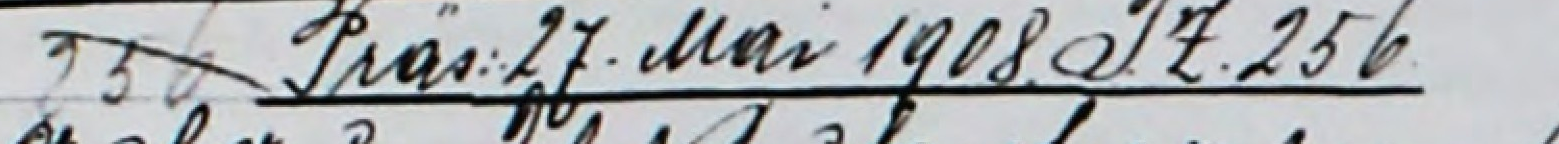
256 Präs: 27. Mai 1908. T.Z. 256
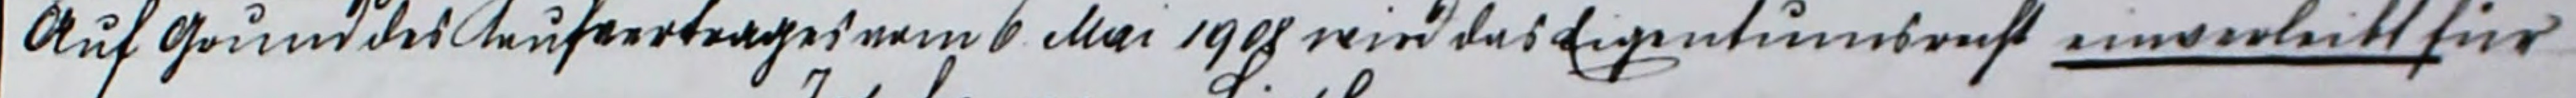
Auf Grund des Kaufvertrages vom 6. Mai 1908 wird das Eigentumsrecht einverleibt für
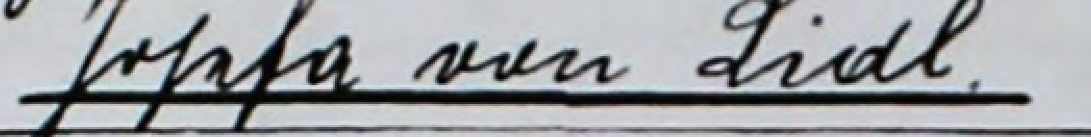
Josefa von Lidl.
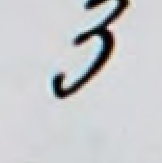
3
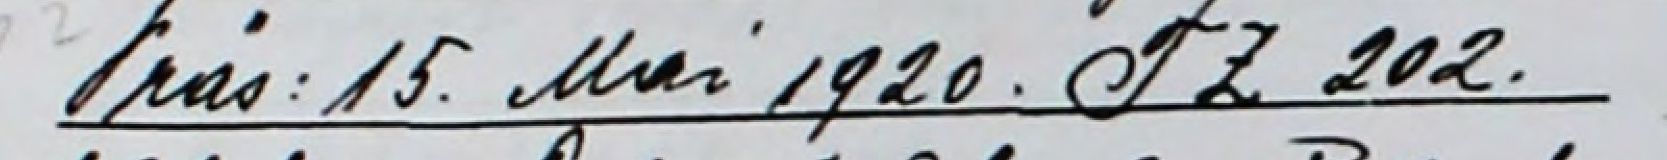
202 Präs: 15. Mai 19200 T Z 202.
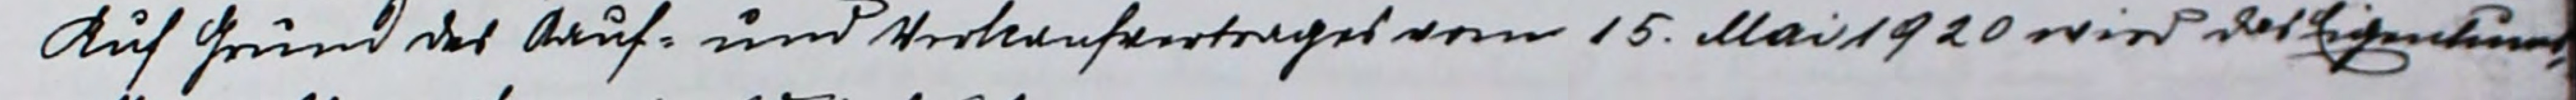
Auf Grund des Kauf= und Verkanfvertrages vom 15. Mai 1920 wird das Eigentums„
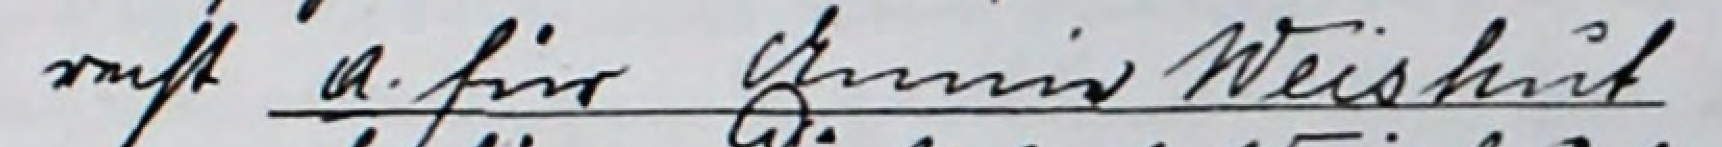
recht a. für Annie Weishut
